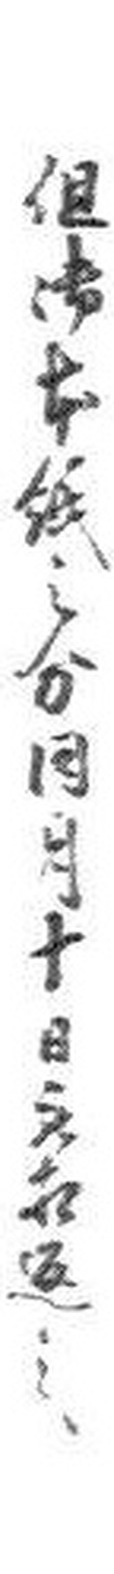但本紙之分同月十日被相返之
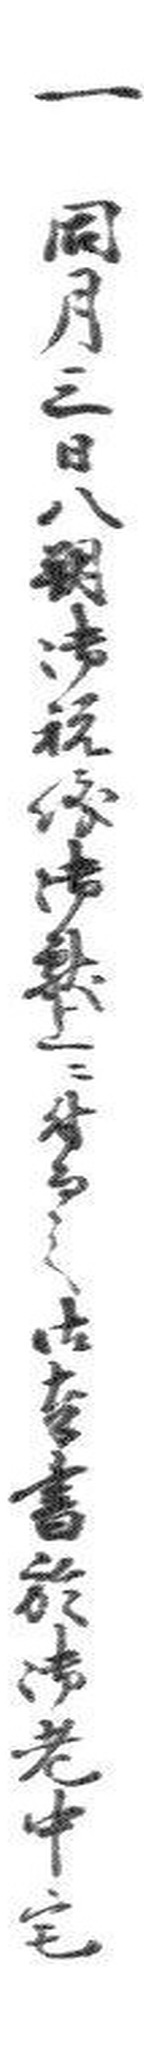一同月三日八朔御祝儀御献上ニ付而之御奉書於御老中宅
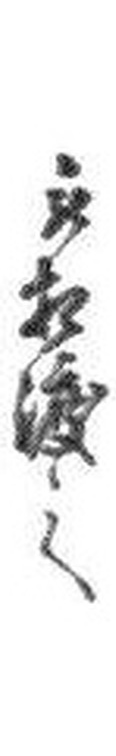被相渡之
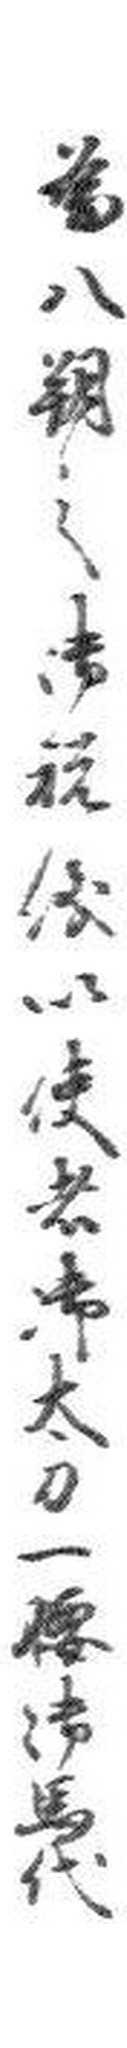為八朔之御祝儀以使者御太刀一腰御馬代
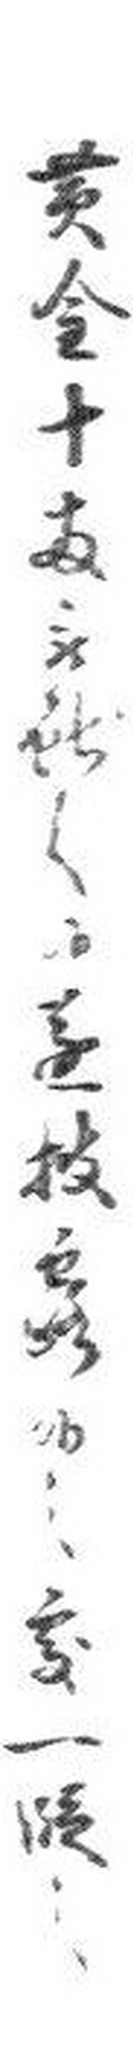黄金十両被献之候遂披露候之処一段之
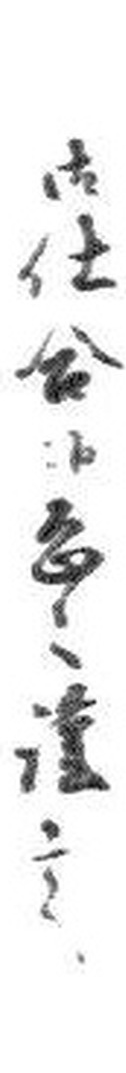御仕合候恐々謹言
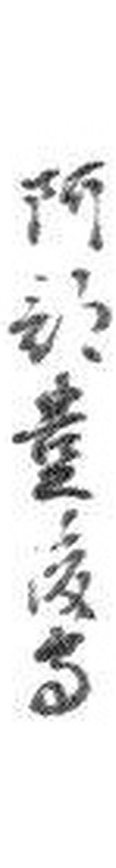阿部豊後守

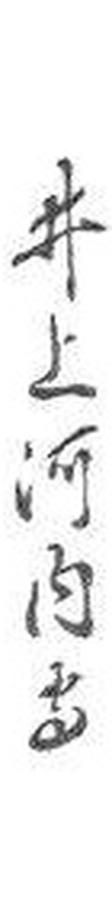井上河内守
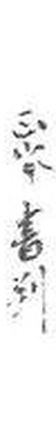正岑書判
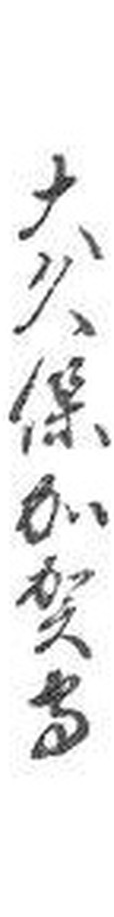大久保加賀守
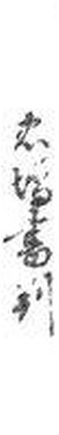忠増書判
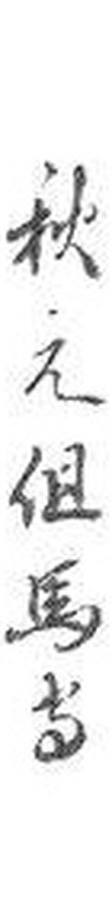秋元但馬守
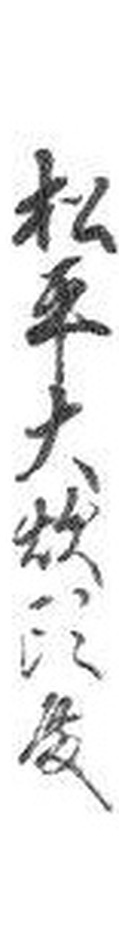松平大炊頭殿
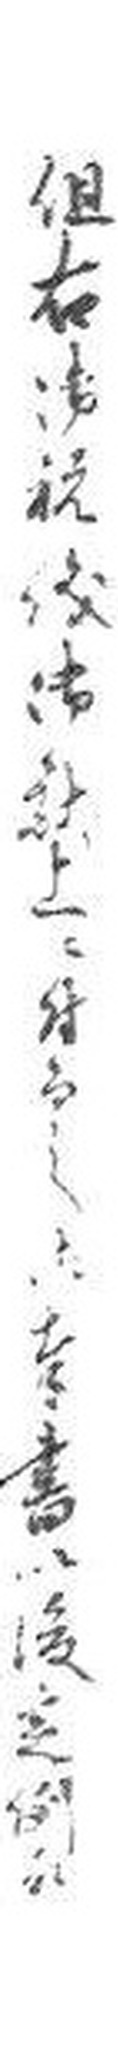但右御祝儀御献上ニ付而之御奉書以後定例故
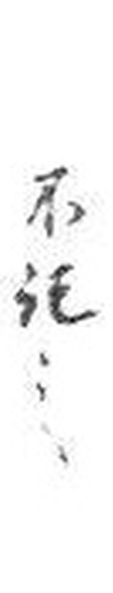不記之
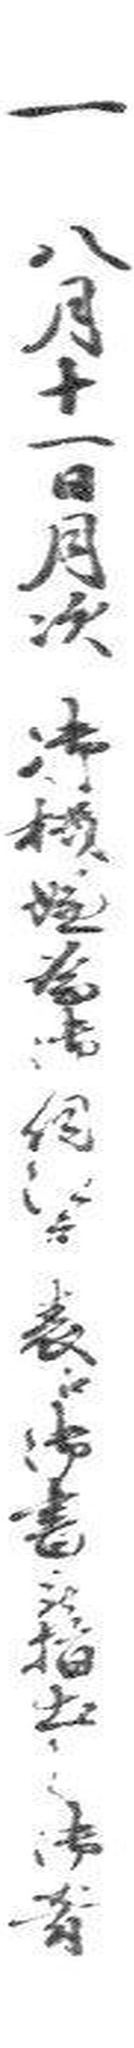一八月十一日月次御機嫌為御伺江戸表江御書被指出之御肴
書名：家譜 二十八 吉邦公 従宝永七年七月五日到正徳元年十二月
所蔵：福井県文書館 Fukui Prefectural Archives
